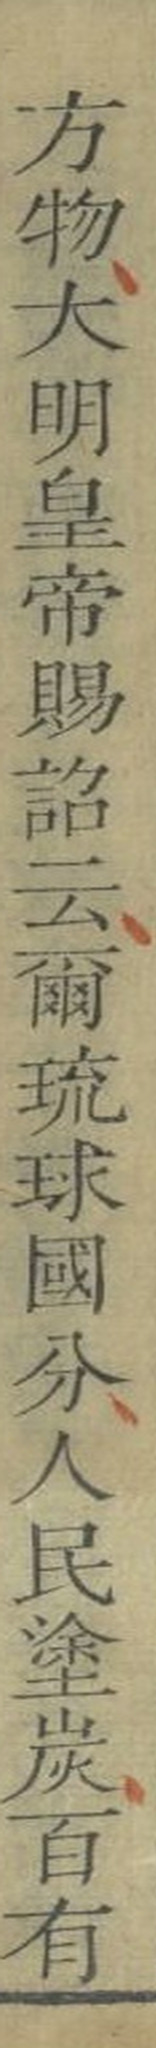方物大明皇帝賜詔云爾琉球国分人民塗炭百有
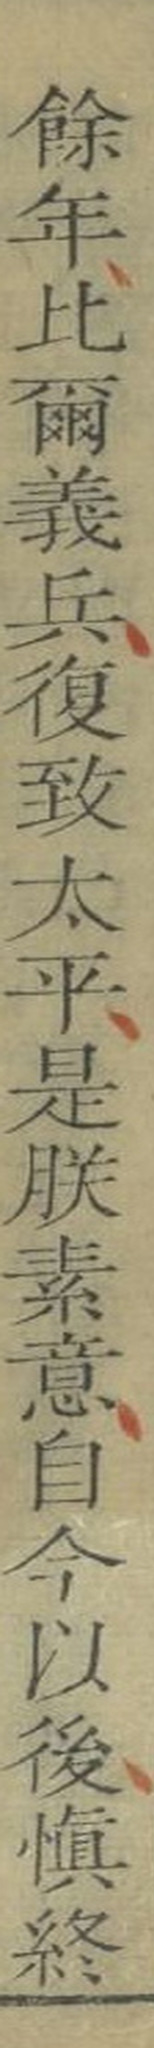余年比爾義兵復致太平是朕素意自今以後慎終
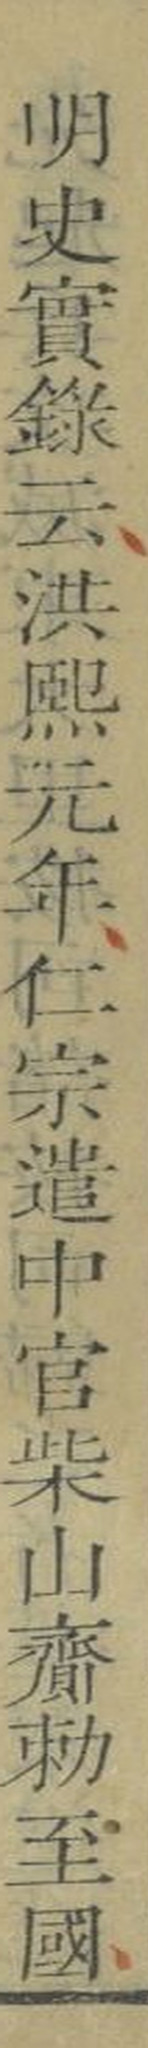明史実録云洪熙元年仁宗遣中官柴山齎勅至国
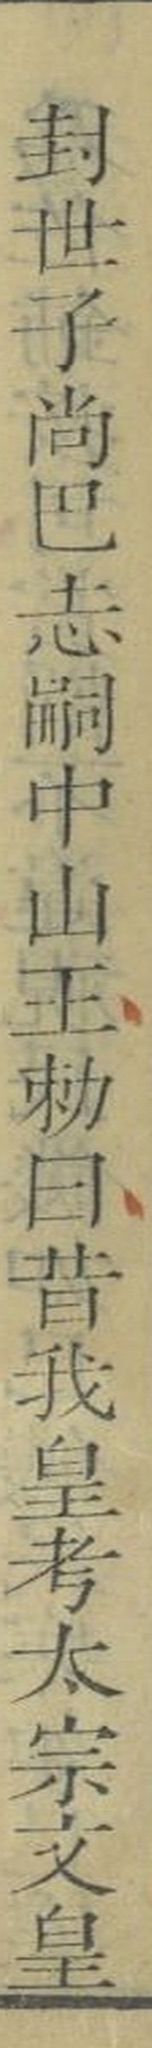封世子尚巴志嗣中山王勅曰昔我皇考太宗文皇
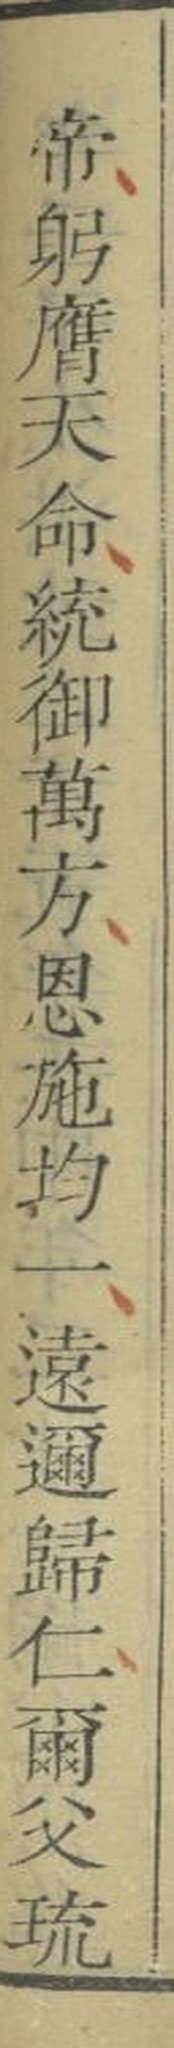帝躬膺天命統御万方恩施均一遠邇帰仁爾父琉
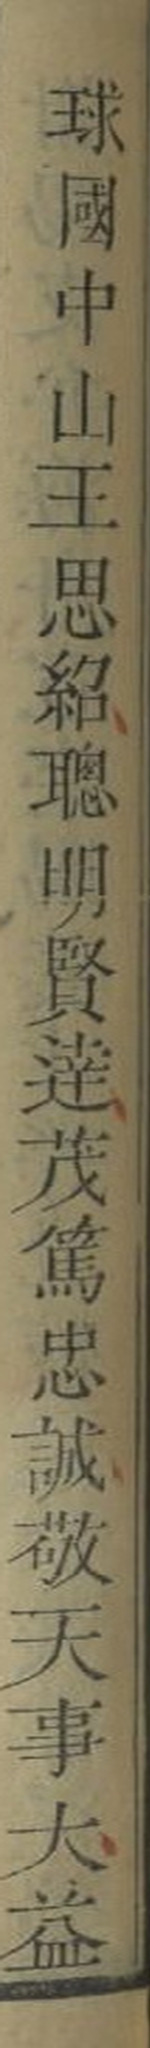球国中山王思紹聡明賢達茂篤忠誠敬天事大益
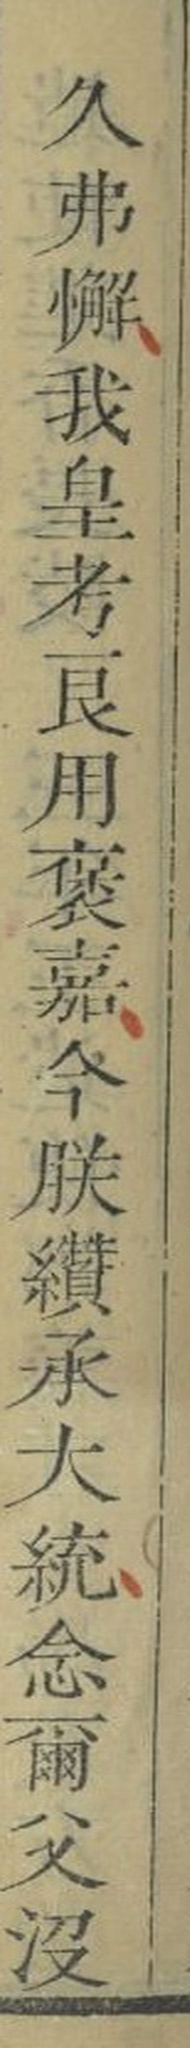久弗懈我皇考良用褒嘉今朕纘承大統念爾父没
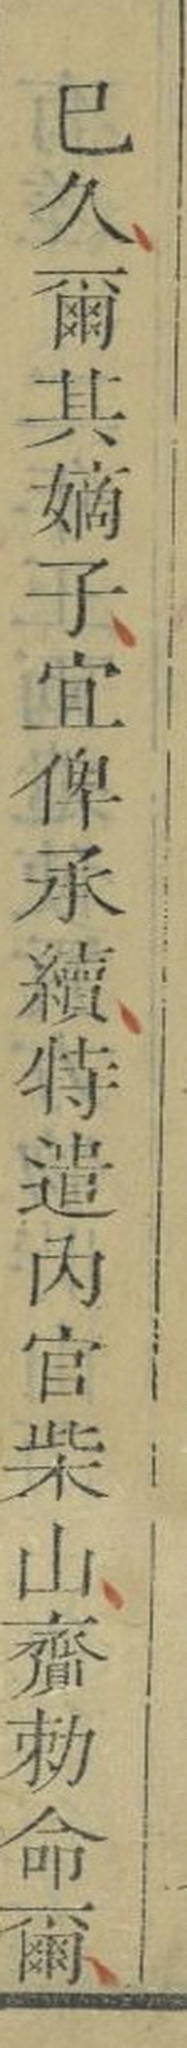巳久爾其嫡子宜俾承続特遣内官柴山齎勅命爾
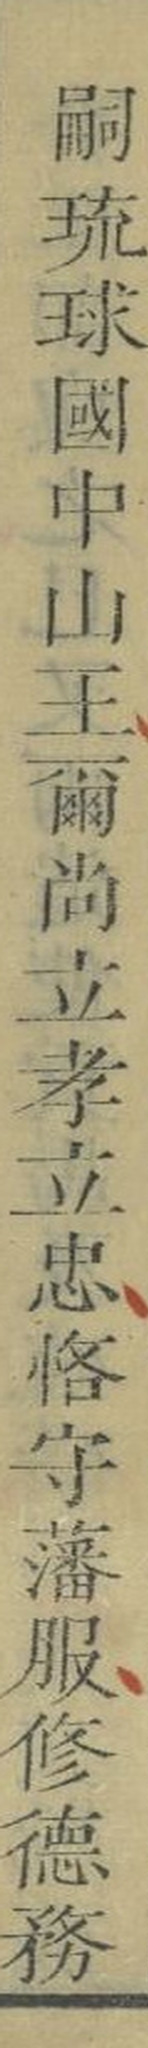嗣琉球国中山王爾尚立孝立忠恪守藩服修徳務
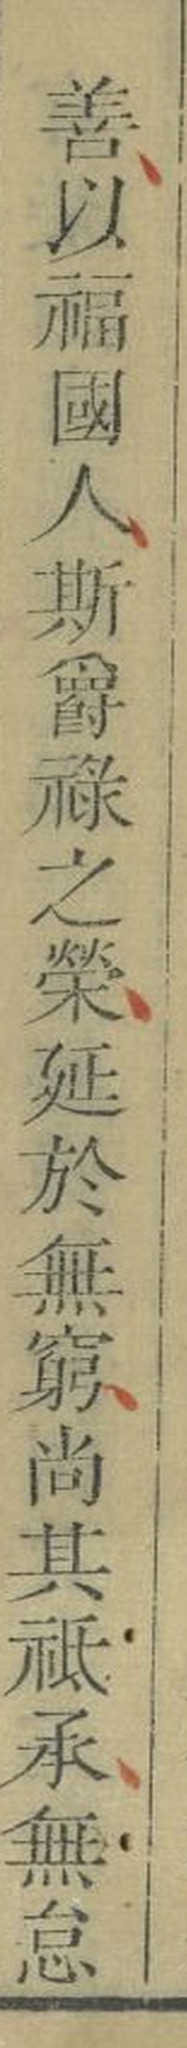善以福国人斯爵禄之栄延於無窮尚其祇承無怠
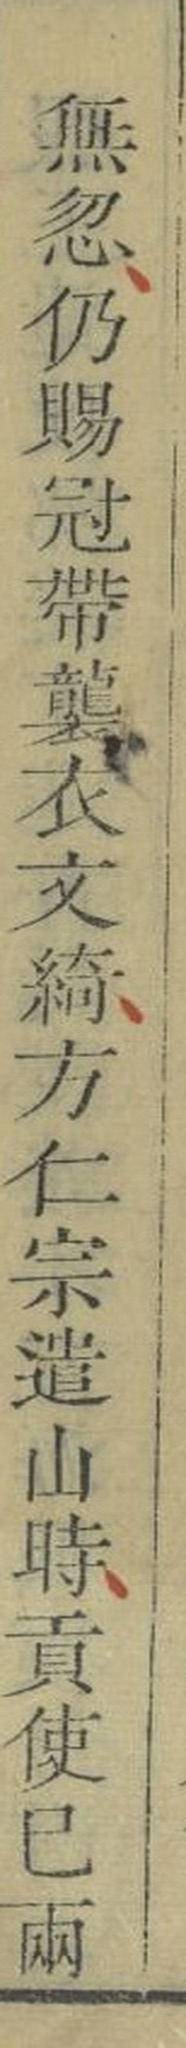無忽仍賜冠帯襲衣文綺方仁宗遣山時貢使巳両
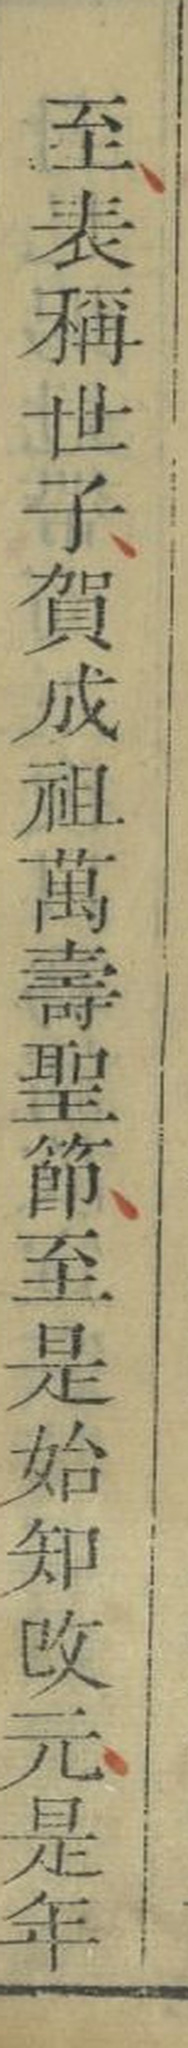至表称世子賀成祖万寿聖節至是始知改元是年
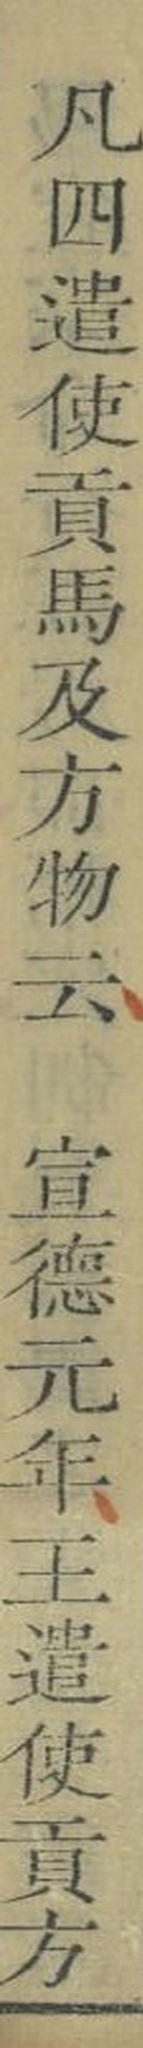凡四遣使貢馬及方物云宣徳元年王遣使貢方
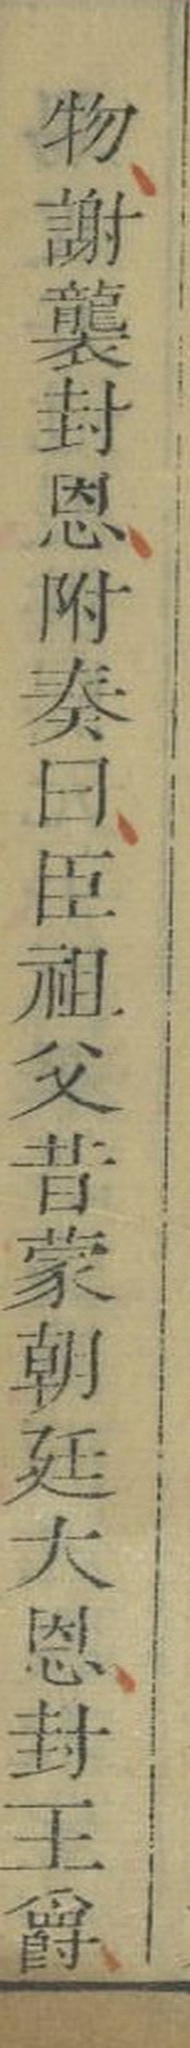物謝襲封恩附奏曰臣祖父昔蒙朝廷大恩封王爵

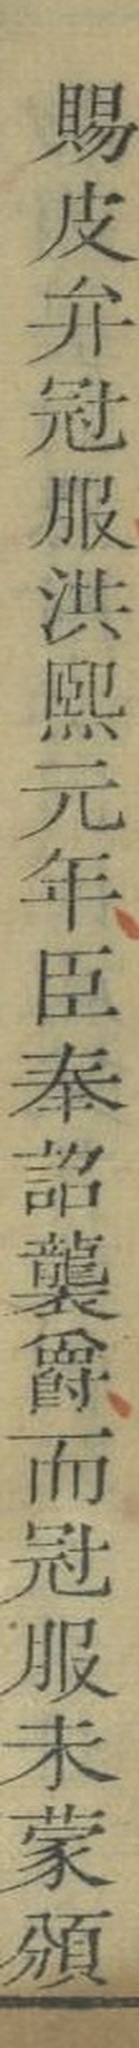賜皮弁冠服洪熙元年臣奉詔襲爵而冠服未蒙頒
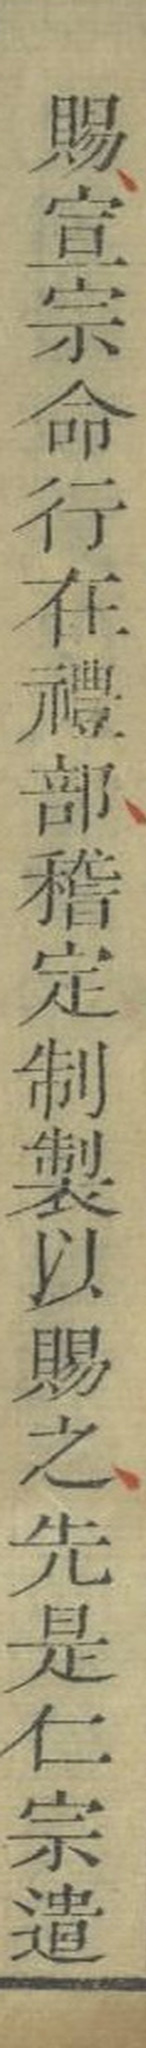賜宣宗命行在礼部稽定制製以賜之先是仁宗遣
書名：中山伝信録 巻三
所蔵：University of the Ryukyus Library
